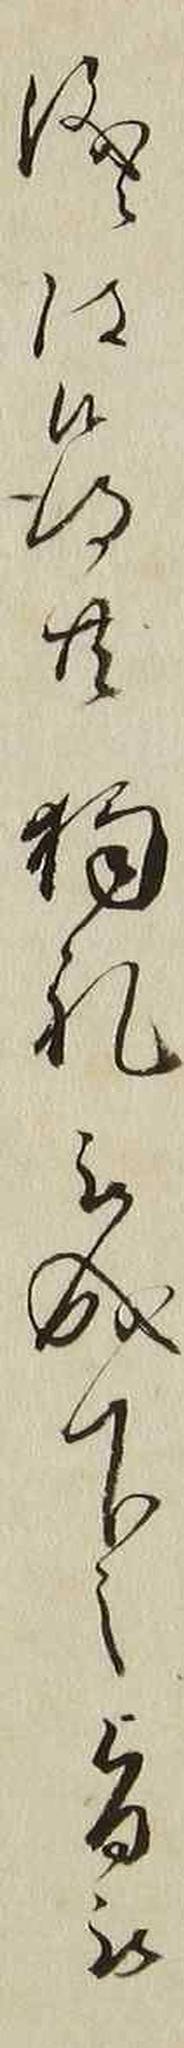儀ニ仕候得共獨礼被成下之旨被
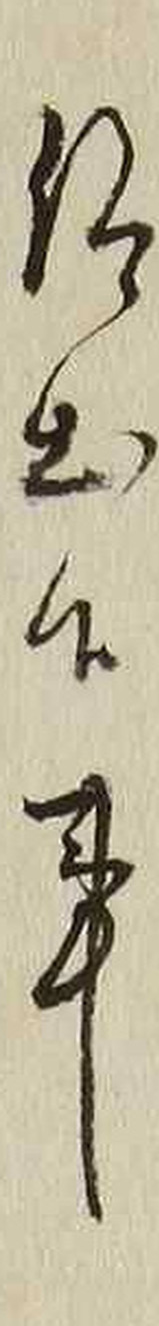仰出候事
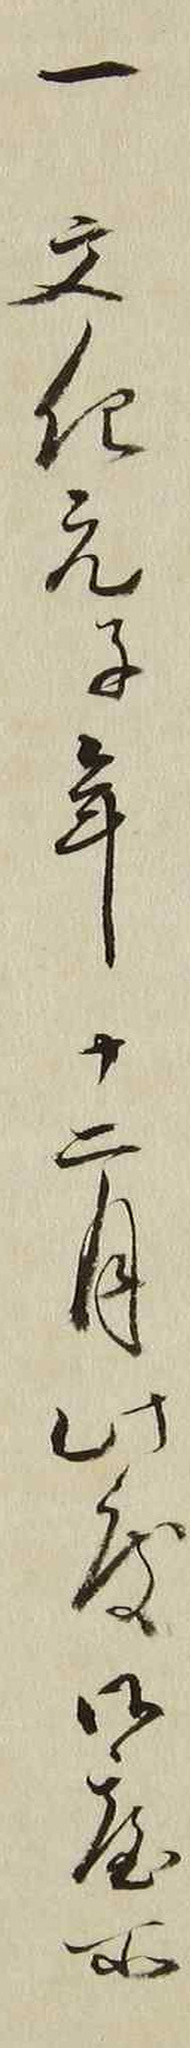一文化元子年十二月此度御台所
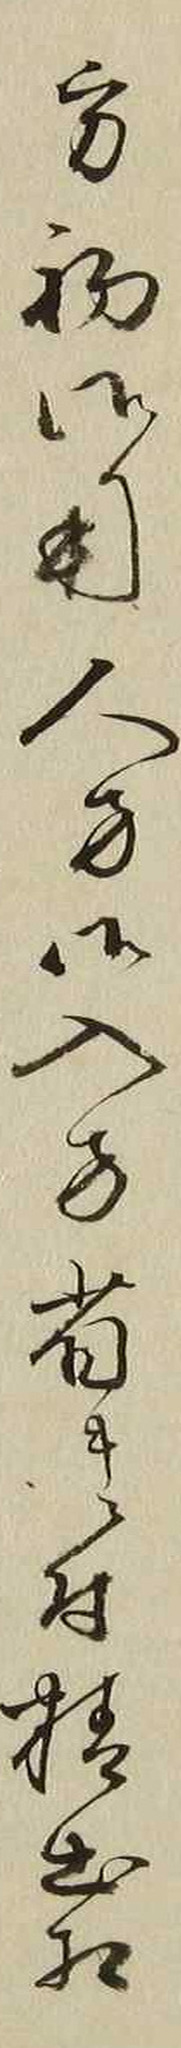方初御用人方御入方省キニ付精出相
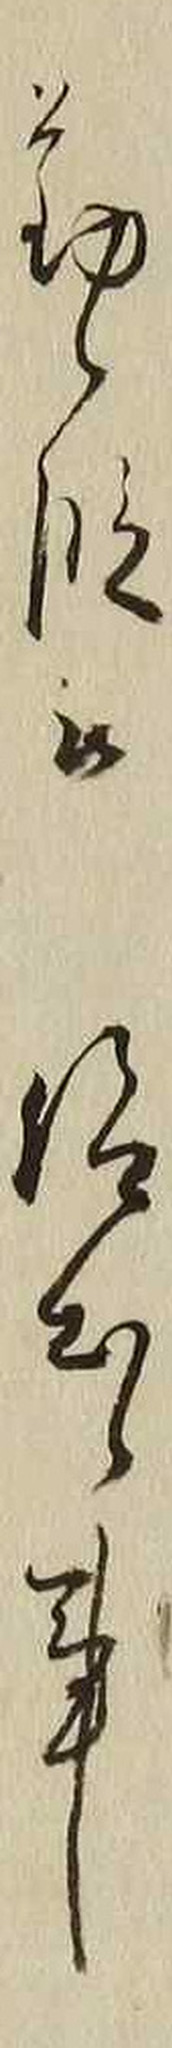勤候段被仰出候事
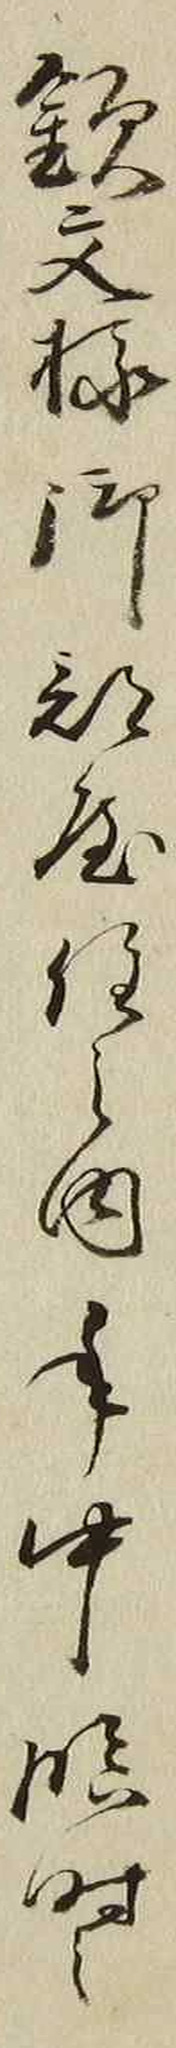欽文様御部屋住之内年中臨時之
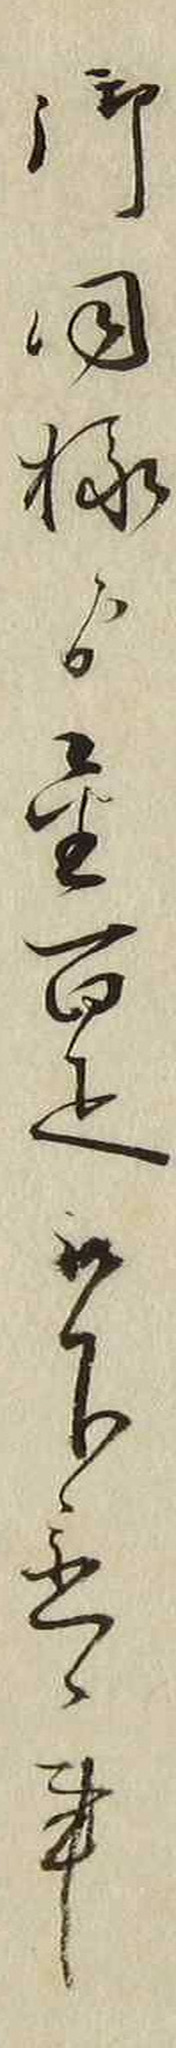御同様ゟ金百疋被下置候事
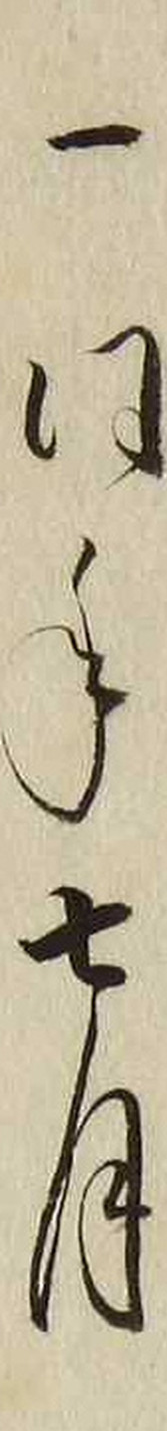一同年七月
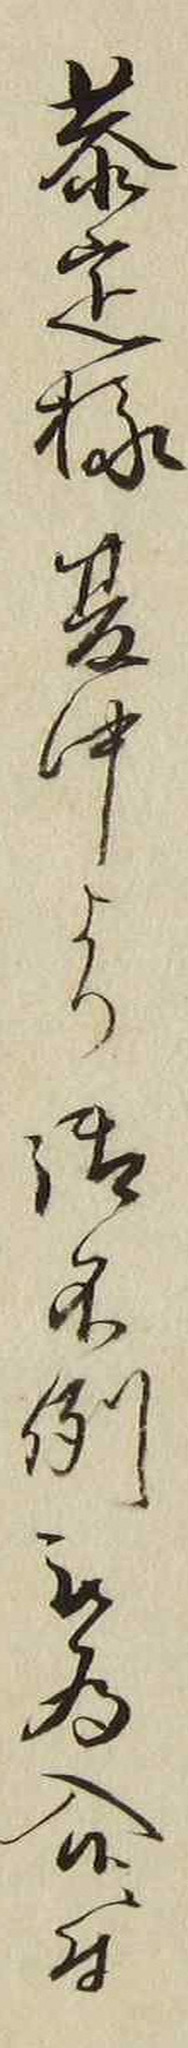恭定様夏中より御不例被為入候付
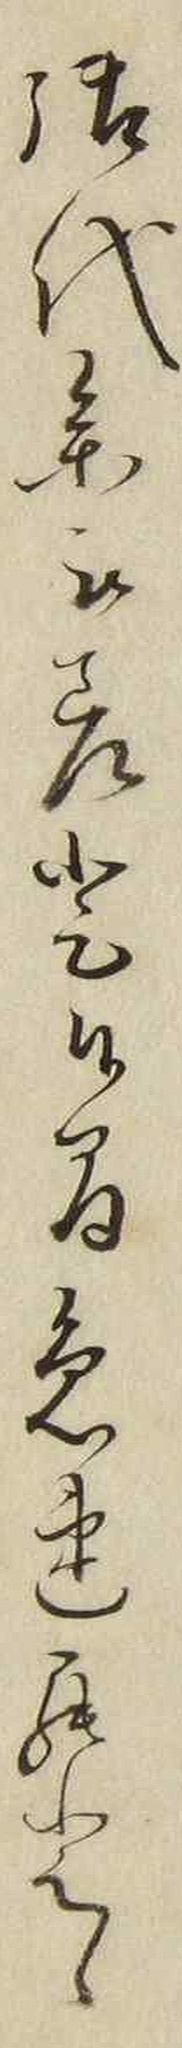御代参被差登候間急速罷登候

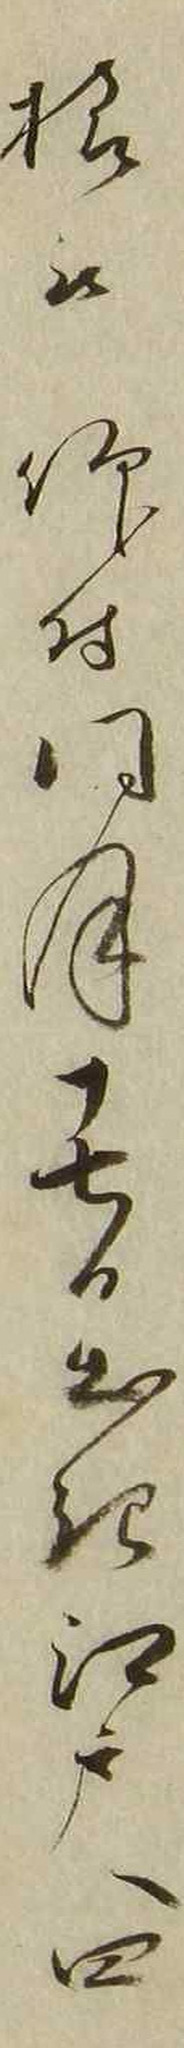様被仰付同月十七日出起江戸へ四
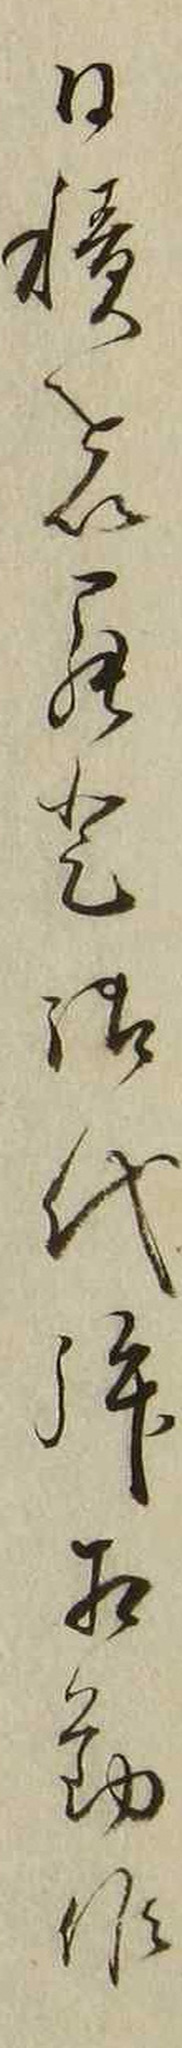日積を以罷登御代拝相勤候
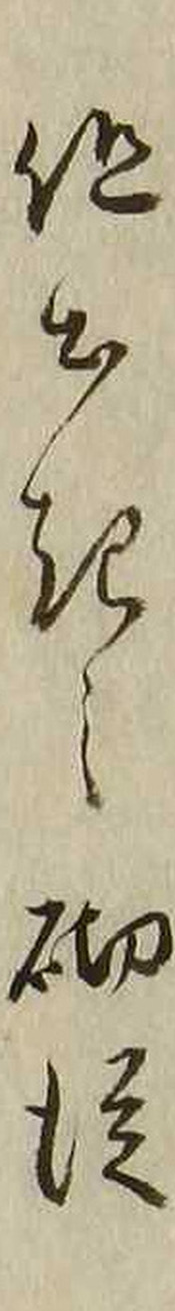但出起之砌従
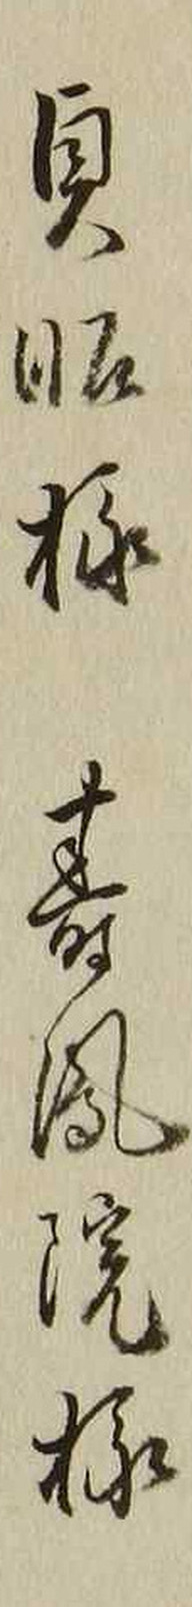貞昭様寿鳳院様
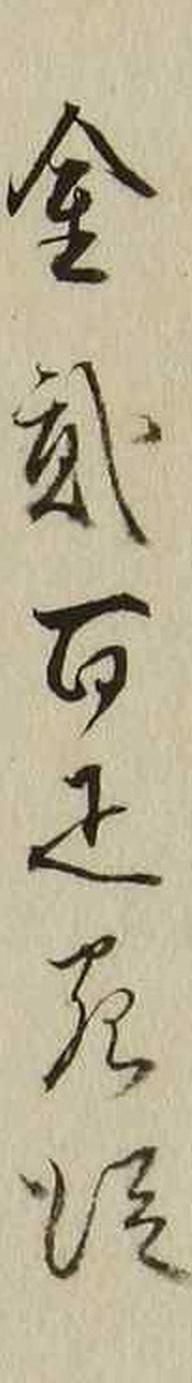金弐百疋宛従
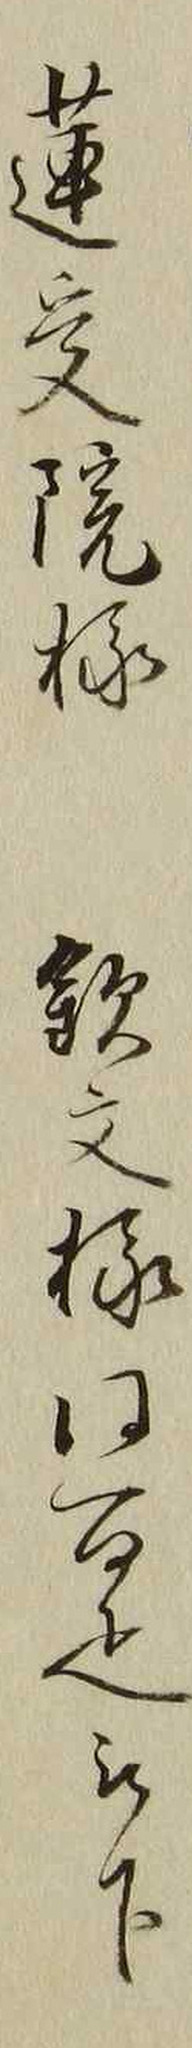蓮受院様欽文様同百疋被下
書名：諸士系譜　巻之10　い之部10
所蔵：会津若松市立会津図書館
